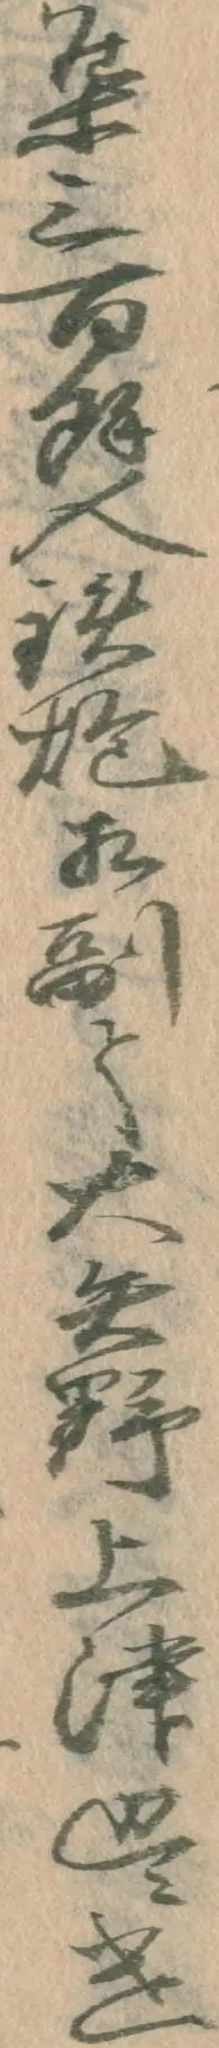集三百余人鉄炮相副て大矢野上津辺に遣
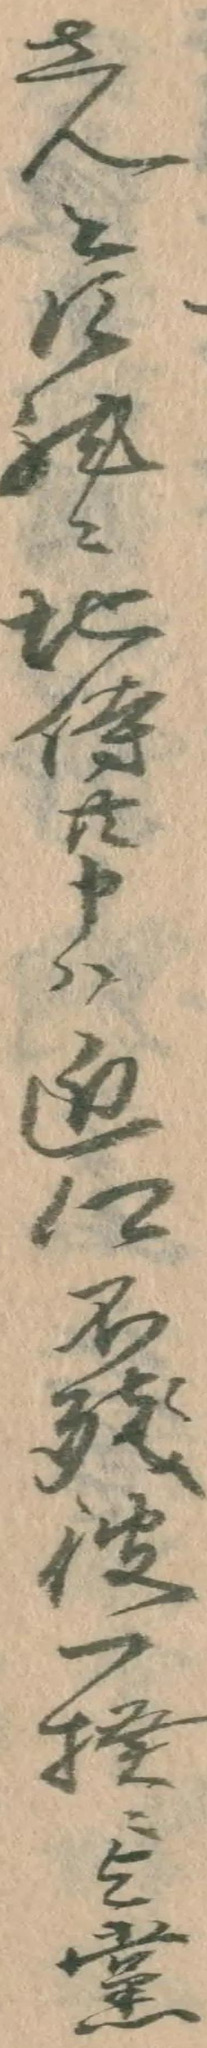さんと須然に地侍共申は近郷不残彼一揆に与党
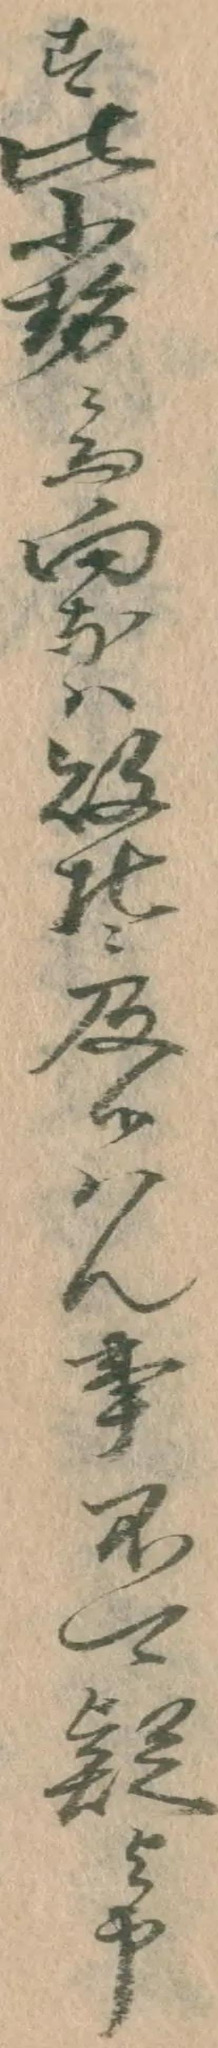春此小勢に而向なは敗北に及候はん事不可疑与申
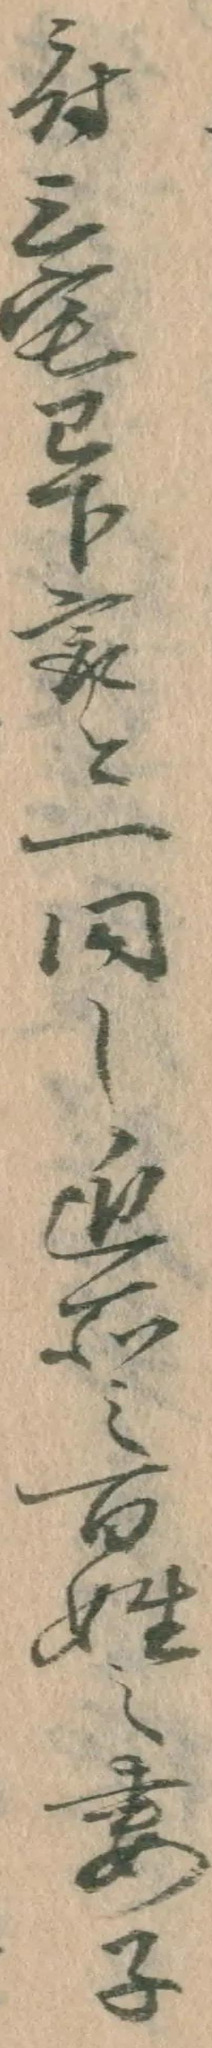に付三宅已下最と一同し近所之百姓之妻子
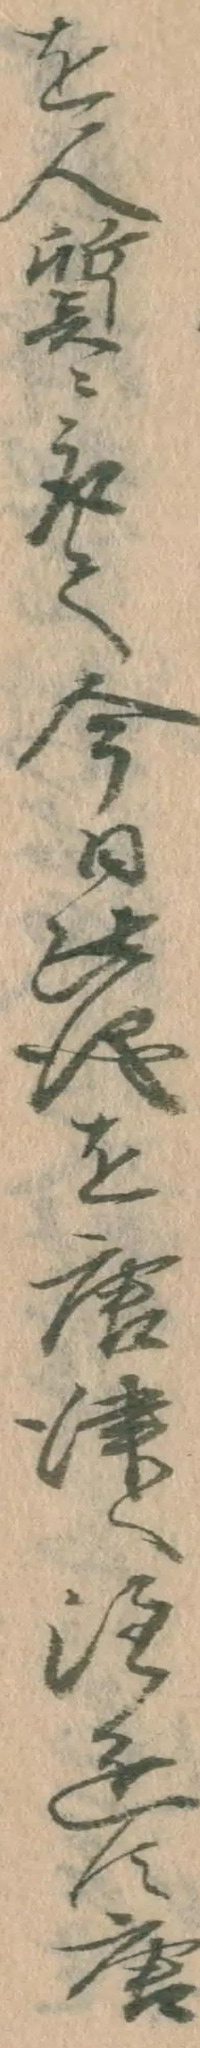を人質に取て今日此儀を唐津へ注進須唐
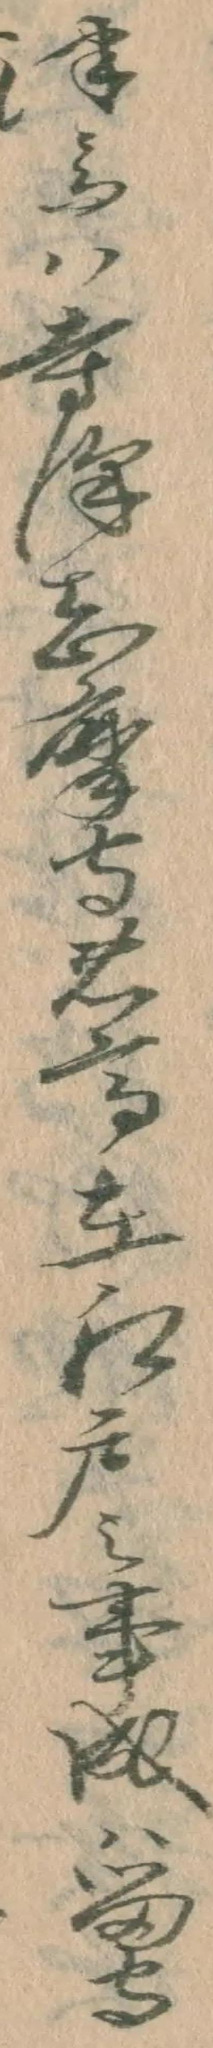津に而は寺沢志摩守忠高在江戸之事成は留守
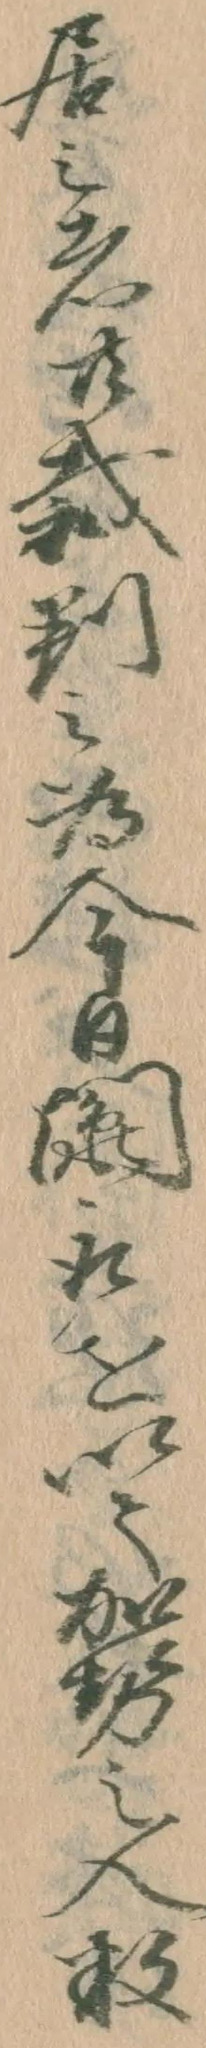居之者共裁判之為今日聞取を以て加勢之人数
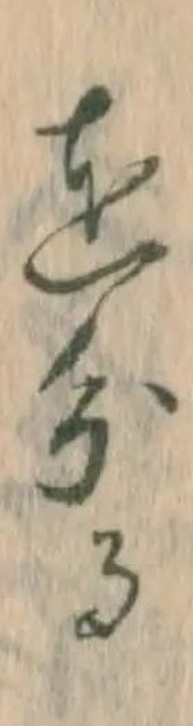を分る
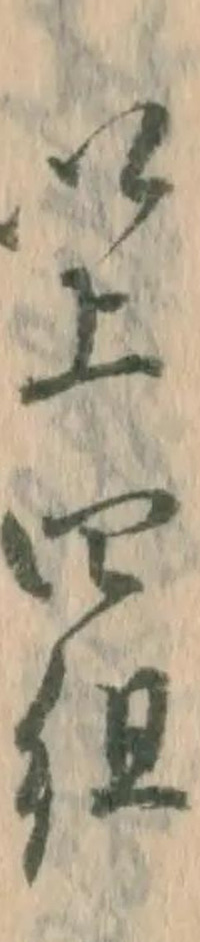以上四組
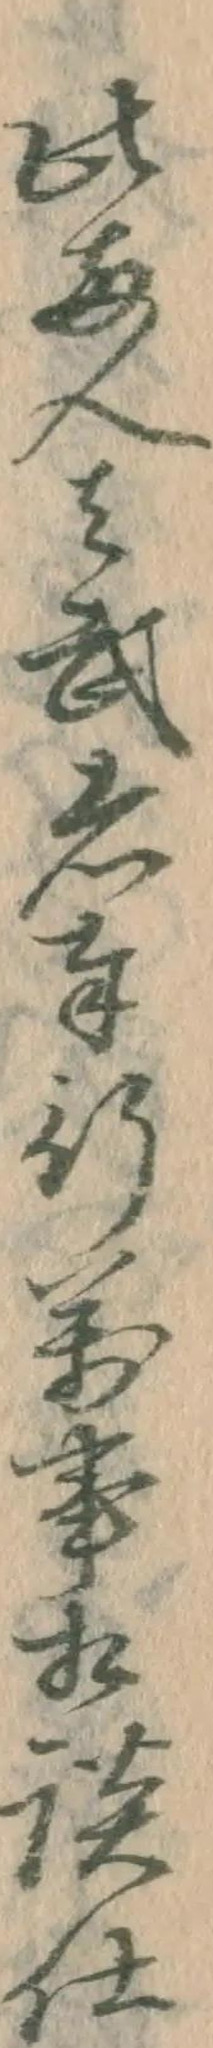此両人は武者奉行万事相談仕

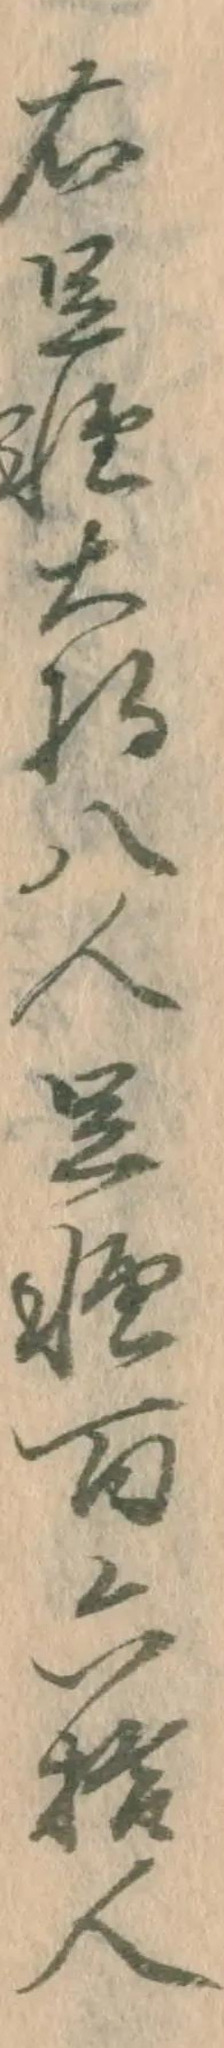右足軽大将八人足軽百六拾人
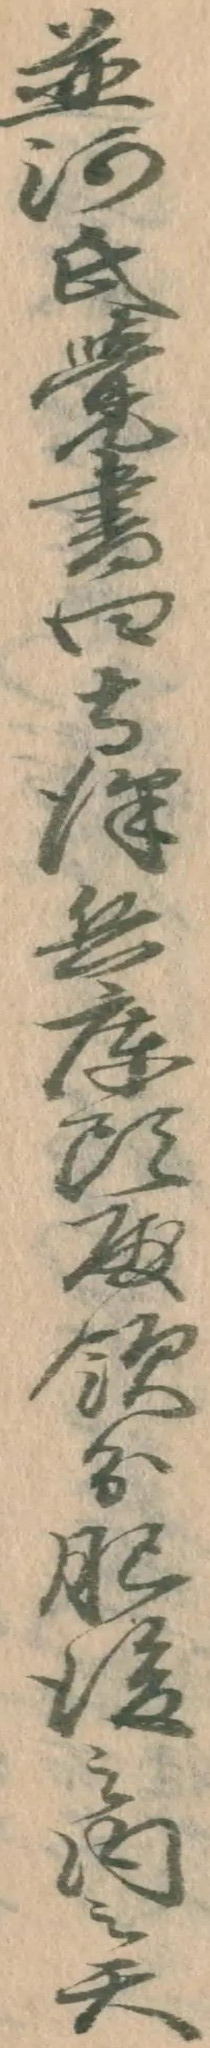並河氏覚書曰寺沢兵庫頭殿領分肥後之内之天
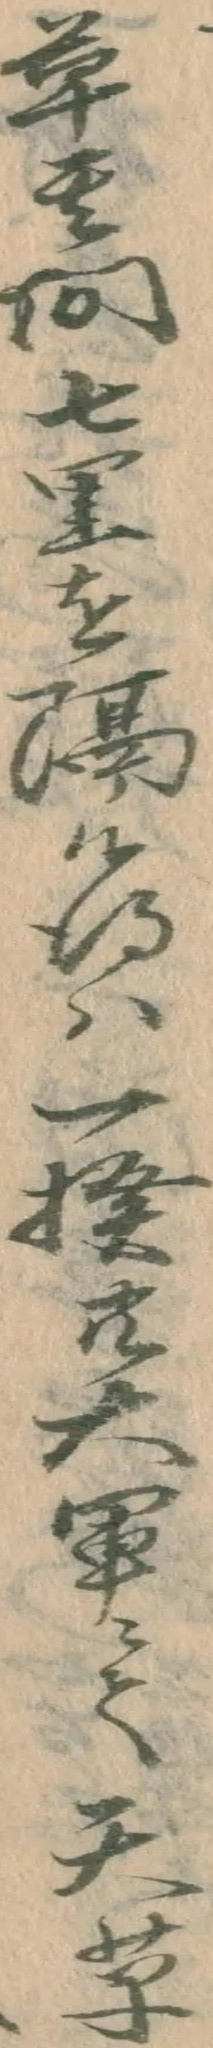草其間七里を隔候得は一揆共大軍にて天草
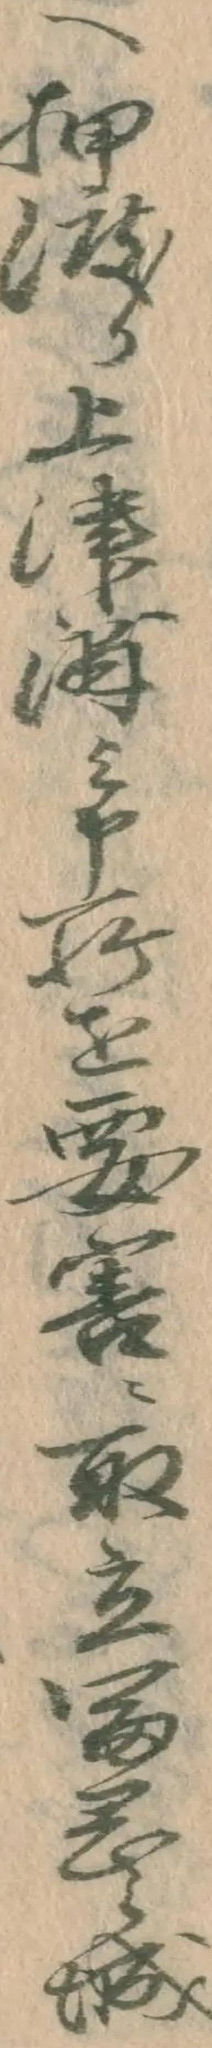へ押渡り上津浦与申所を要害に取立冨岡之城
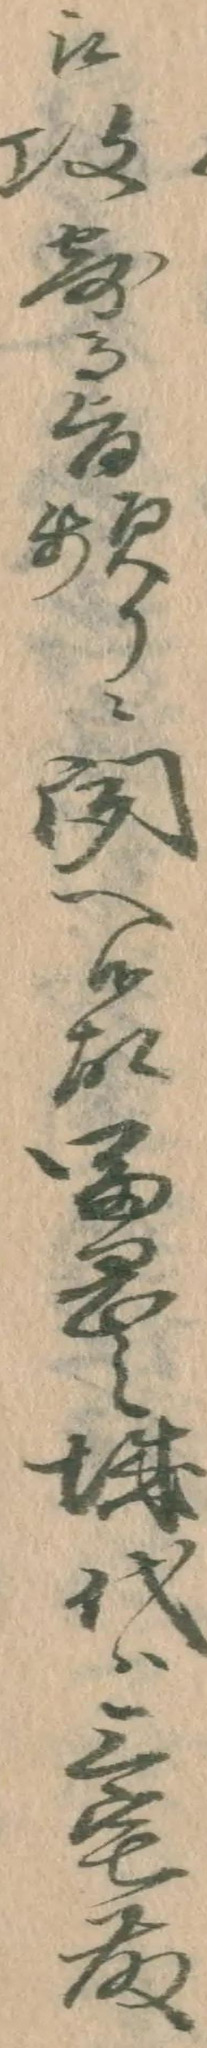江攻寄る旨頻りに聞へ候冨岡之城代は三宅藤
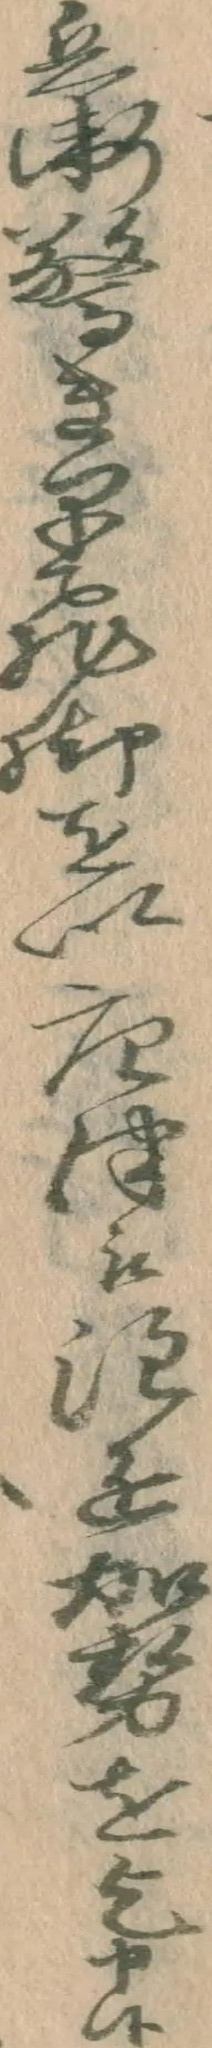兵衛驚き早飛脚を以唐津江注進加勢を乞申候
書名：切支丹御退治記 49巻. [2]
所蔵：国立国会図書館 National Diet Library, JAPAN
